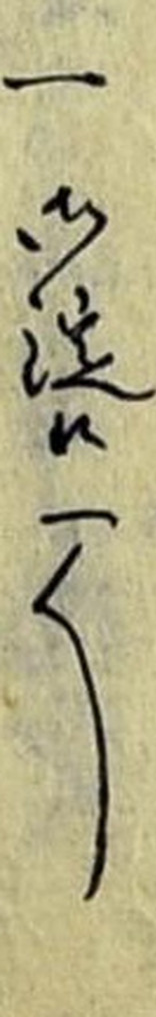一御使番一人
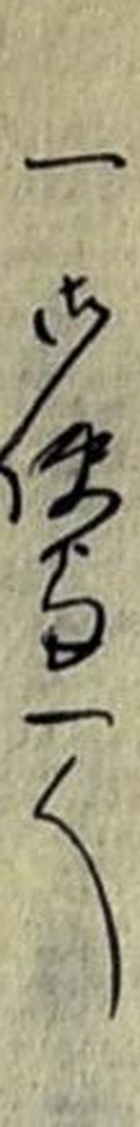一御使番一人
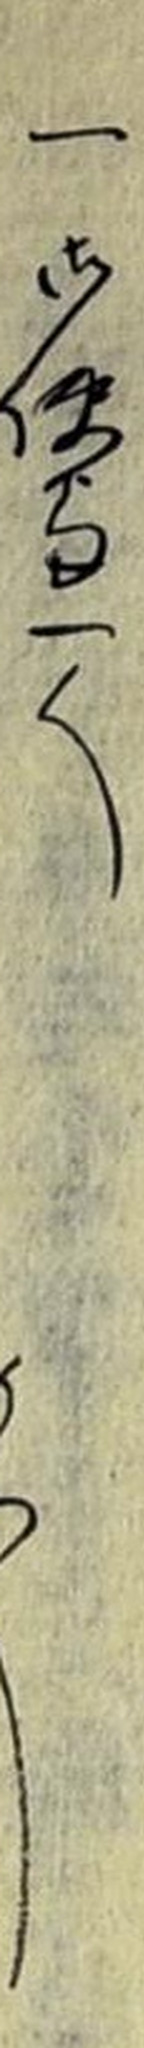一御使番一人
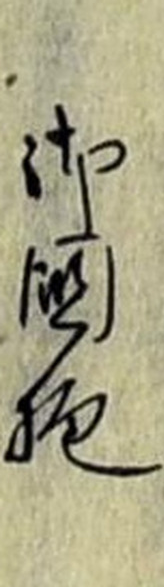御国抱
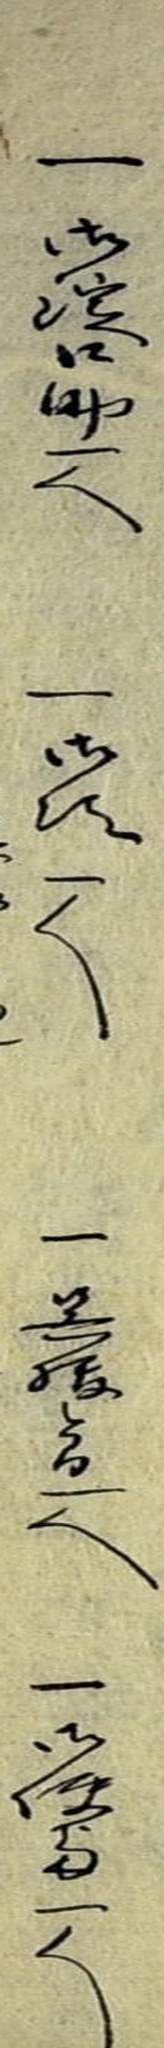一御錠口助一人一御次一人一呉服之間一人一御使番一人
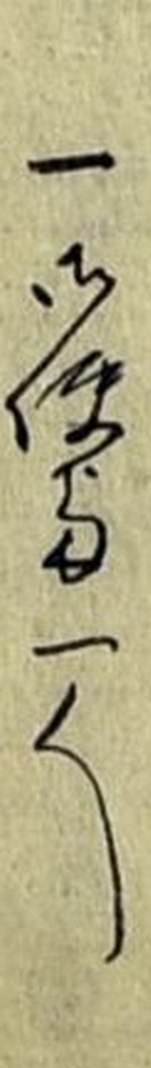一御使番一人
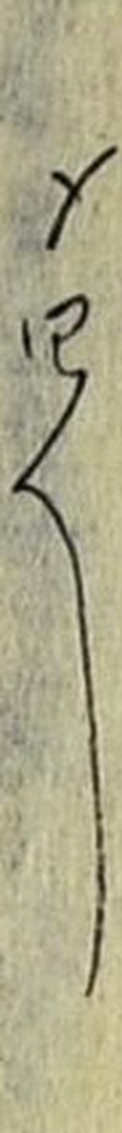〆四人
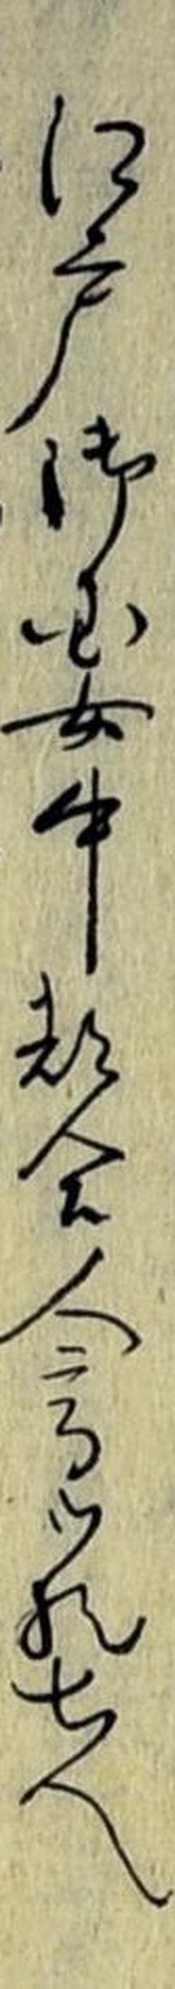江戸御国女中都合人高弐拾七人
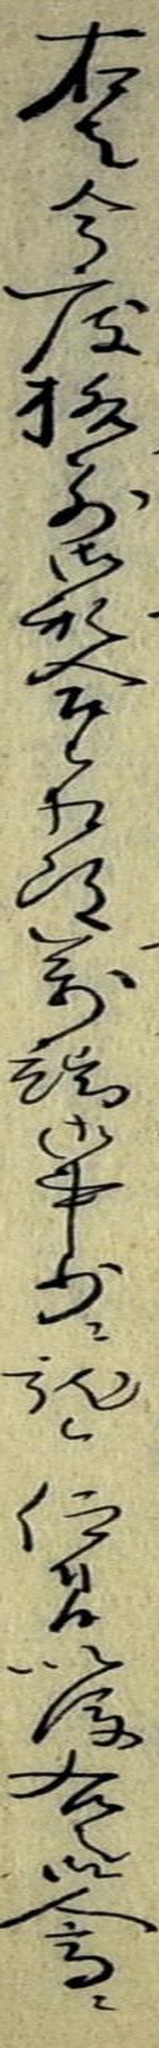右は今度格別御形合被相改万端御事少に就被仰付候以後右之御人高に
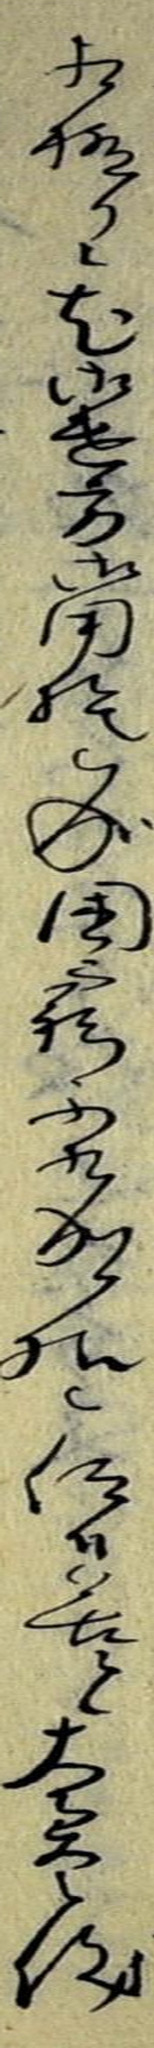相極り候尤御遣方御用捨被成困窮不相成候様被仰付筈に候大奥之儀
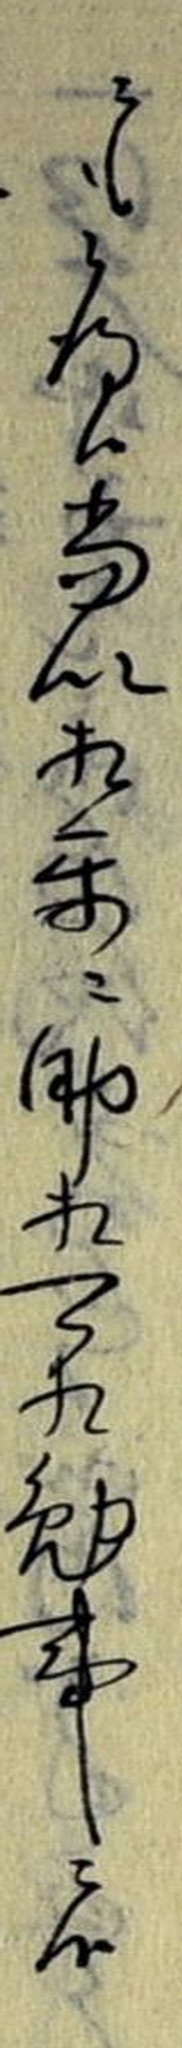にも候得は尚以相互に助相可相勉事に候
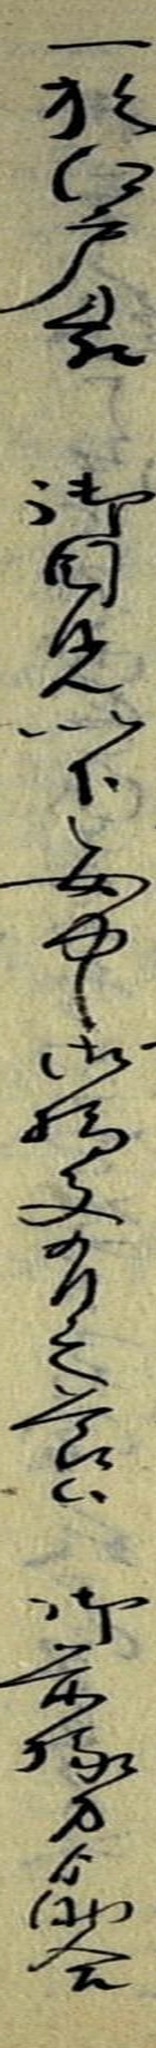一於江戸表御目見以下之女中御指支有之節は御前様方ゟ助合
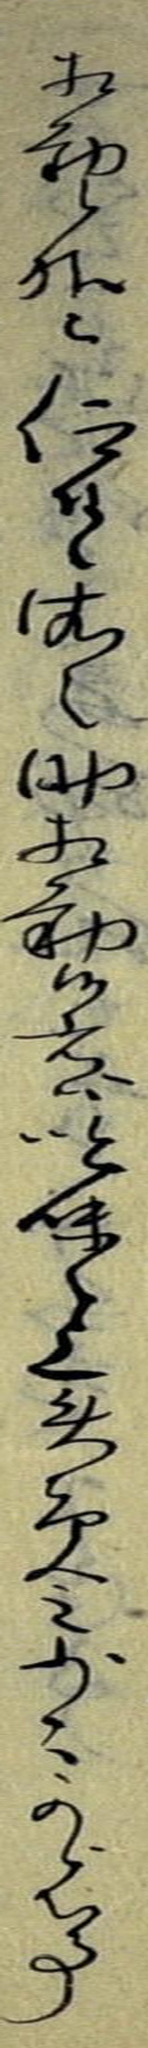相勤候様被仰付候依之助相勤候者へは吟味之上失却金少々可被下事
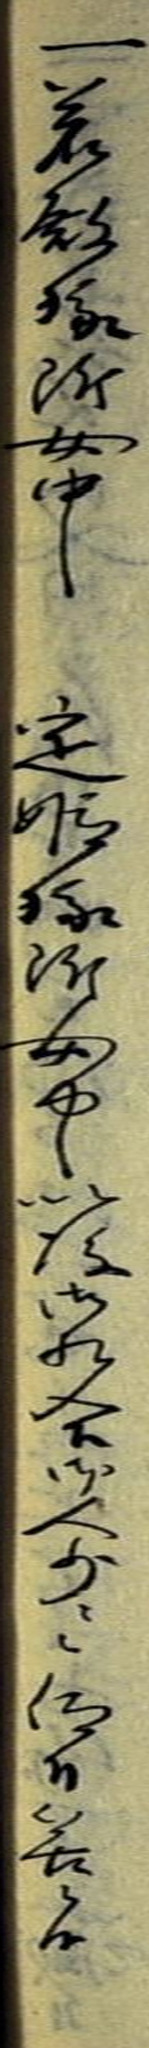一若殿様附女中定姫様附女中以後御相合御人少に被仰付筈に候
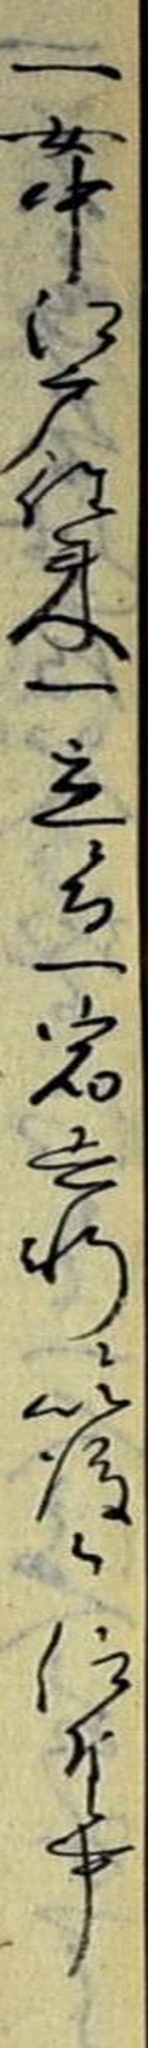一女中江戸往来一立に而一宿壱軒に以後被仰付候事
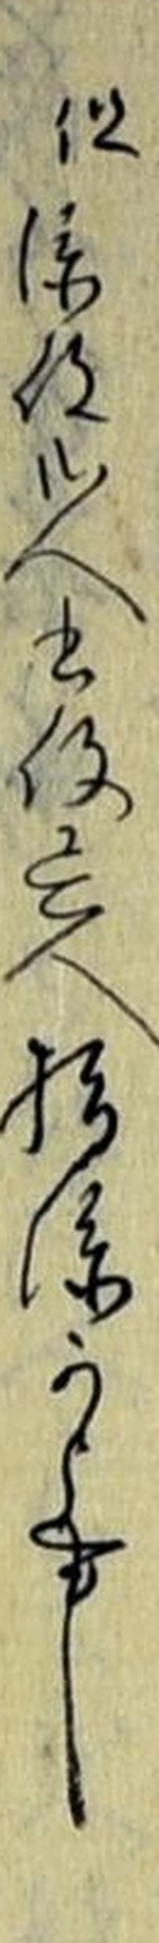但添役弐人書役壱人指添可申事
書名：命令之部 二
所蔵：福井県文書館 Fukui Prefectural Archives
